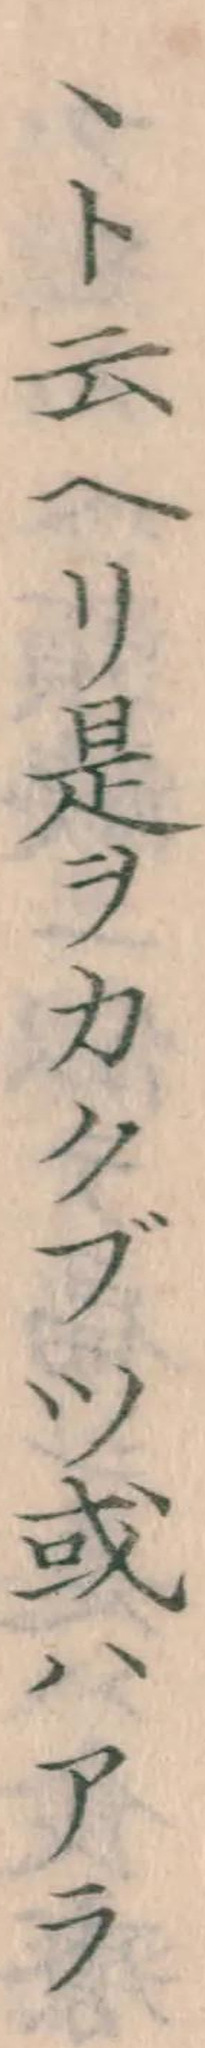ヽト云ヘリ是ヲカクブツ或ハアラ
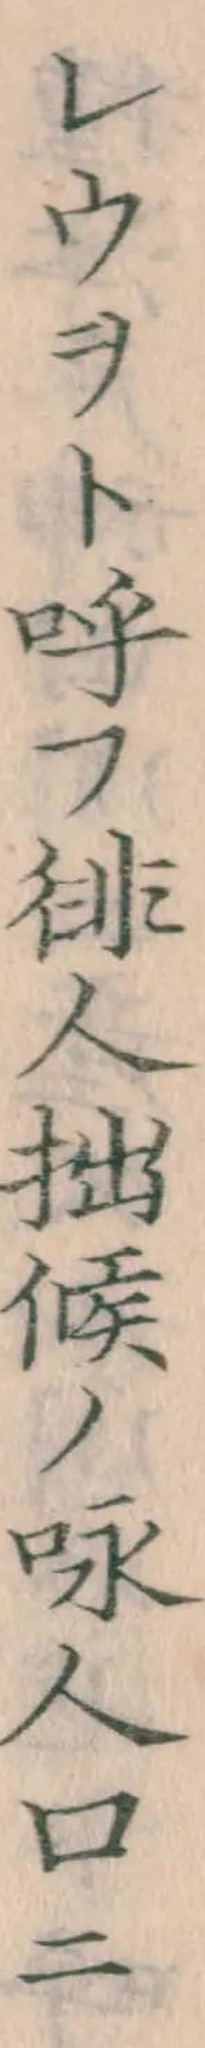レウヲト呼フ徘人拙候ノ咏人口ニ
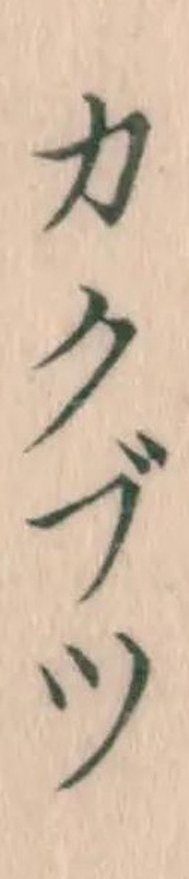カクブツ
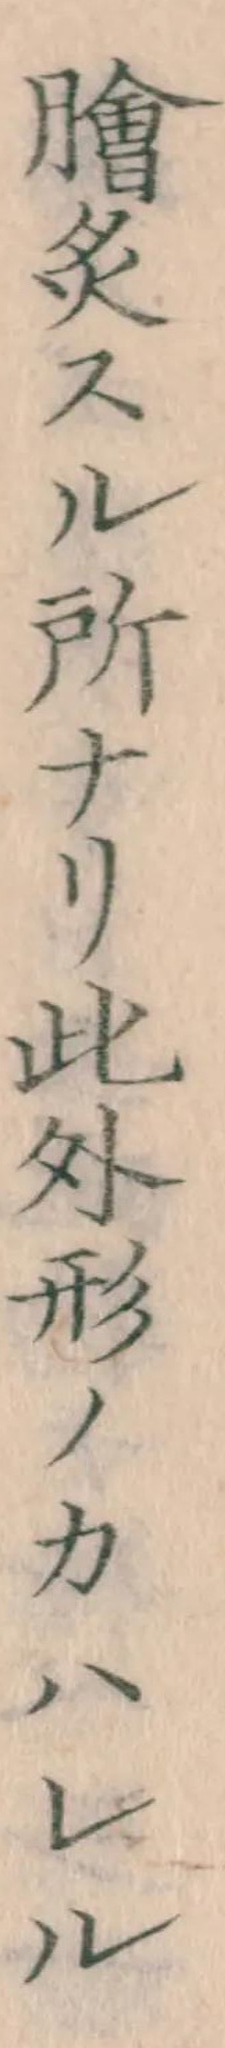膾炙スル所ナリ此外形ノカハレル
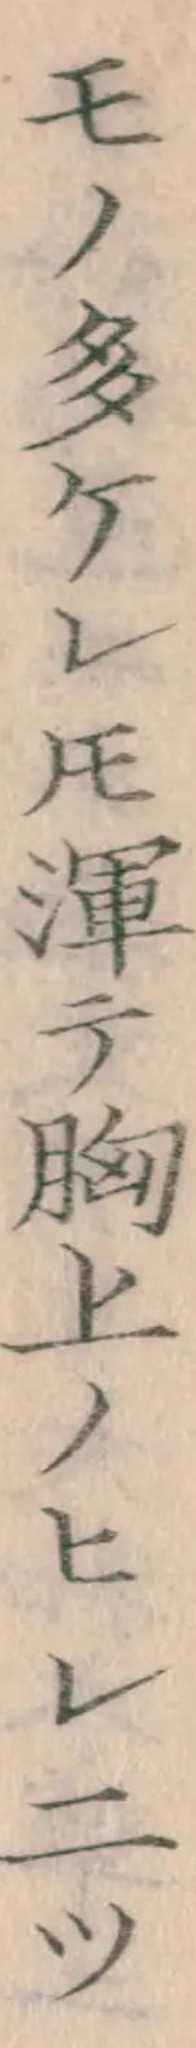モノ多ケレトモ渾テ胸上ノヒレ二ツ
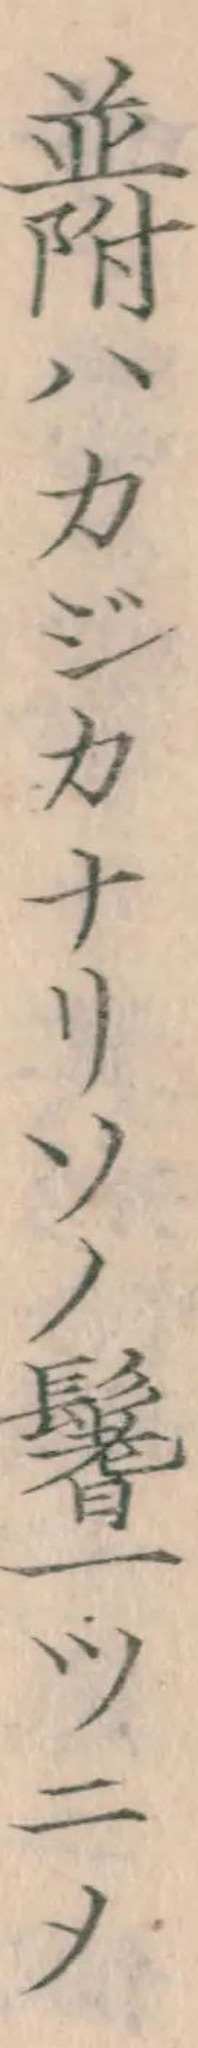並附ハカジカナリソノ鬐一ツニシテ
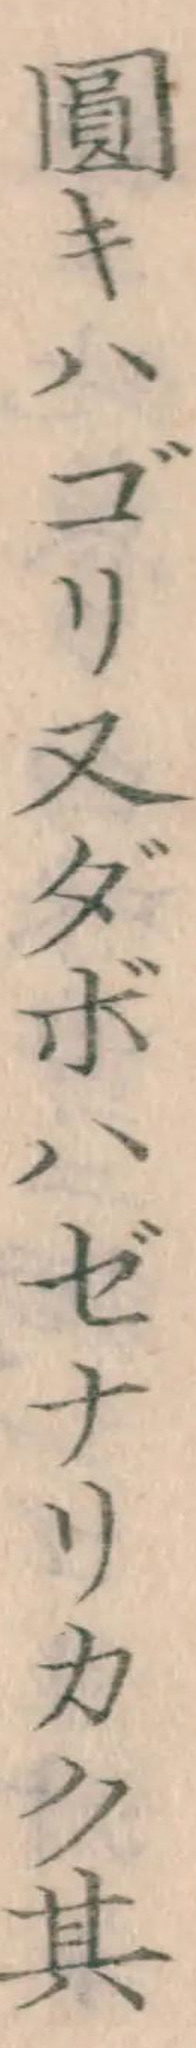円キハゴリ又ダボハゼナリカク其
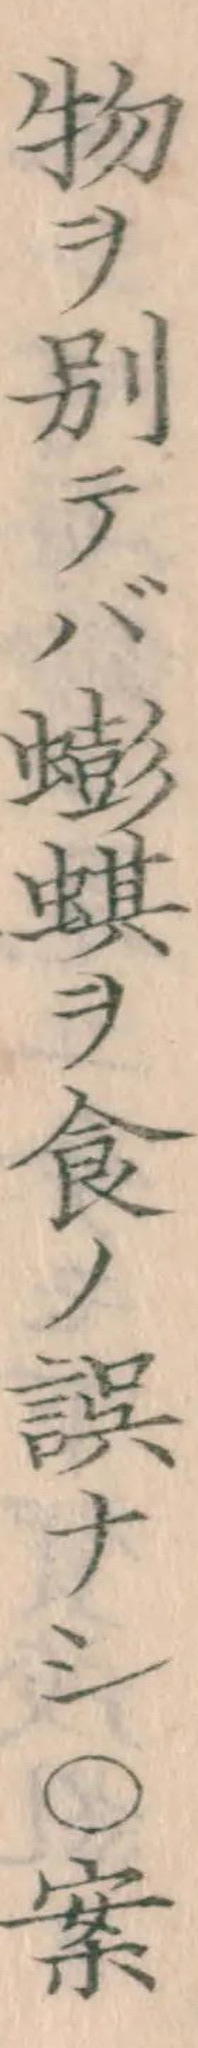物ヲ別テバ蟛蜞ヲ食ノ誤ナシ〇案
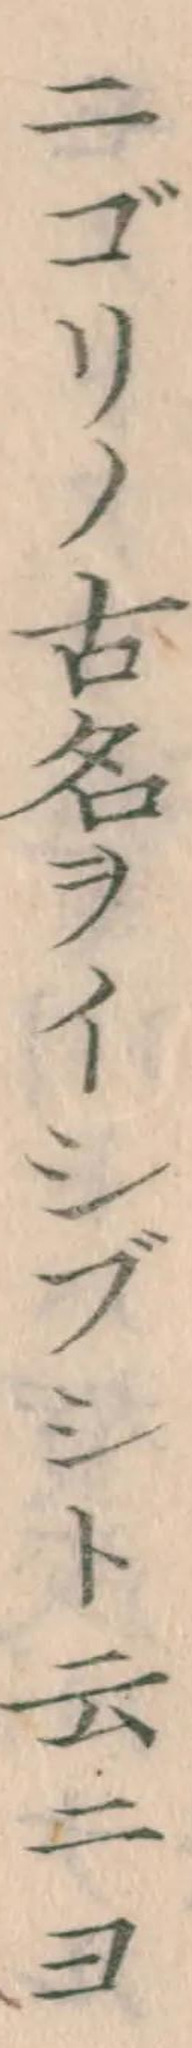ニゴリノ古名ヲイシブシト云ニヨ
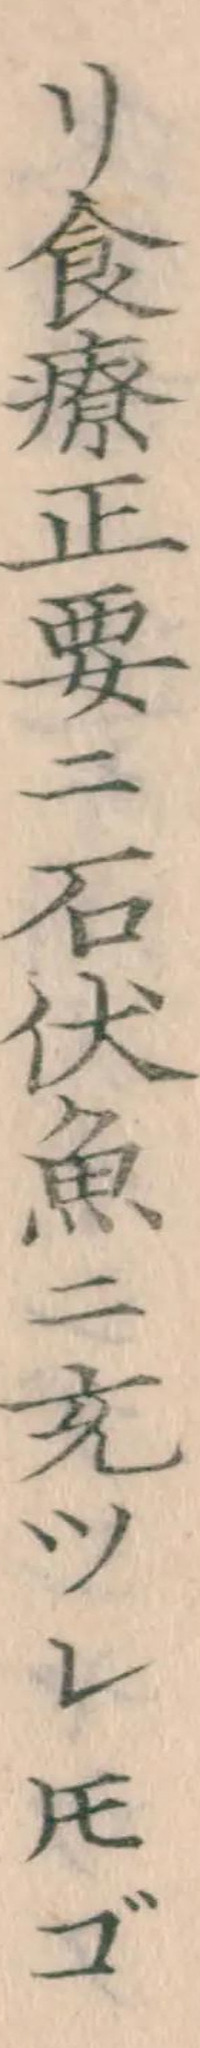リ食療正要ニ石伏魚ニ充ツレトモゴ
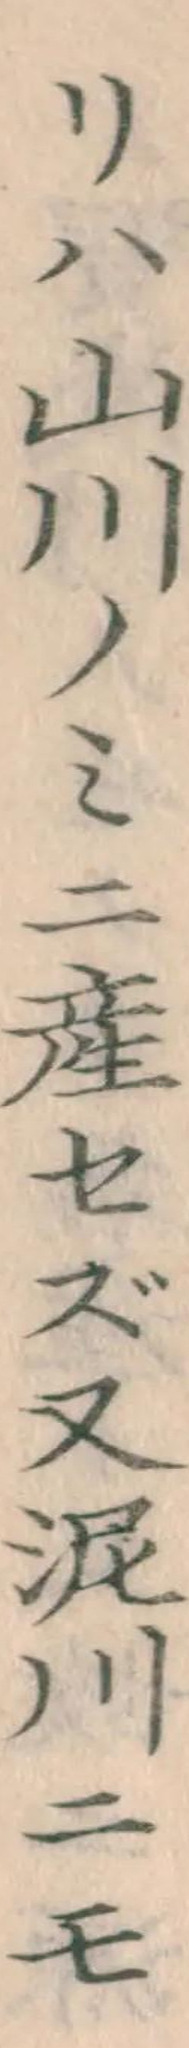リハ山川ノミニ産セズ又泥川ニモ
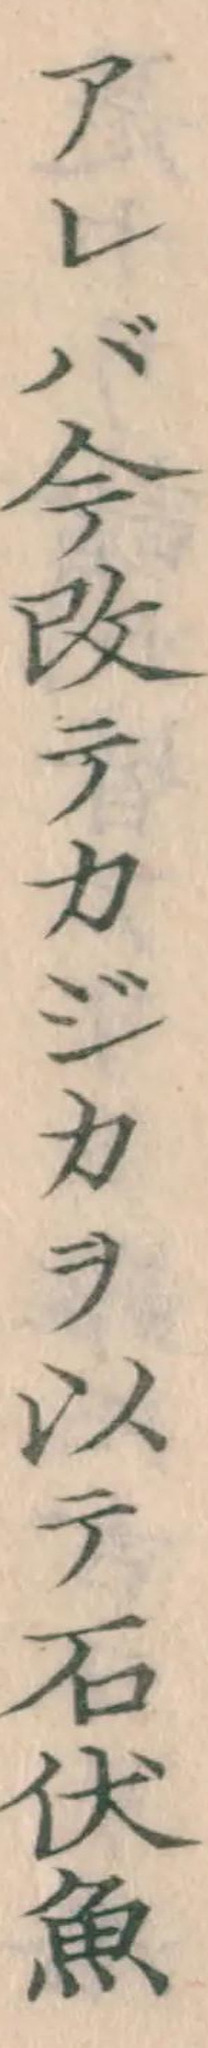アレバ今改テカジカヲ以テ石伏魚
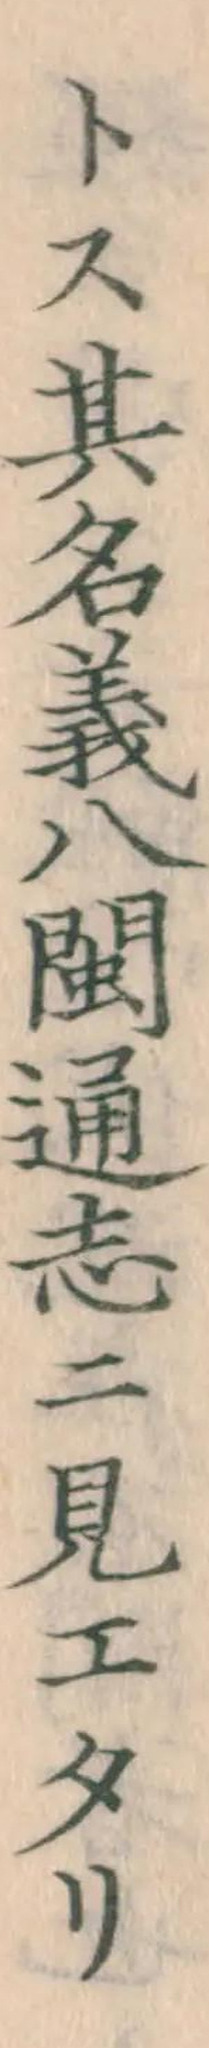トス其名義八閩通志ニ見エタリ

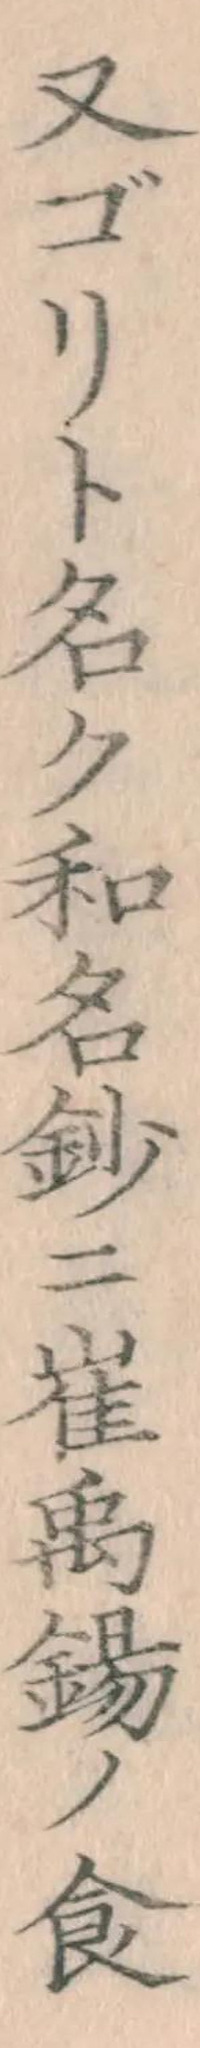又ゴリト名ク和名鈔ニ崔禹錫ノ食
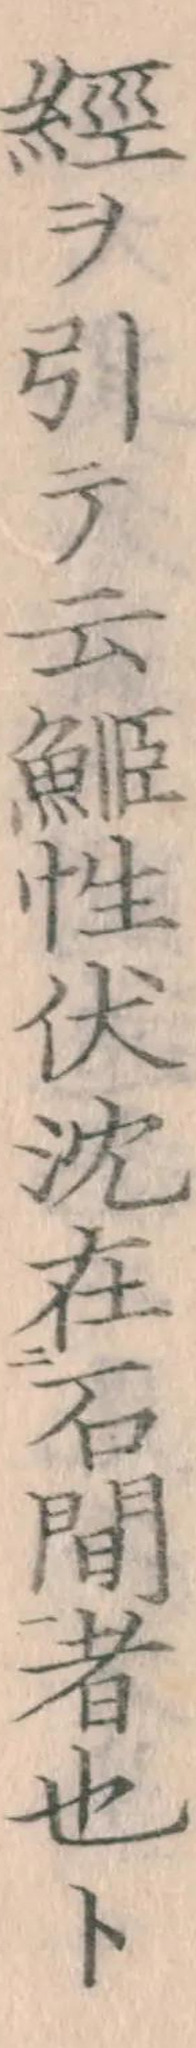経ヲ引テ云性伏沈在石間者也ト
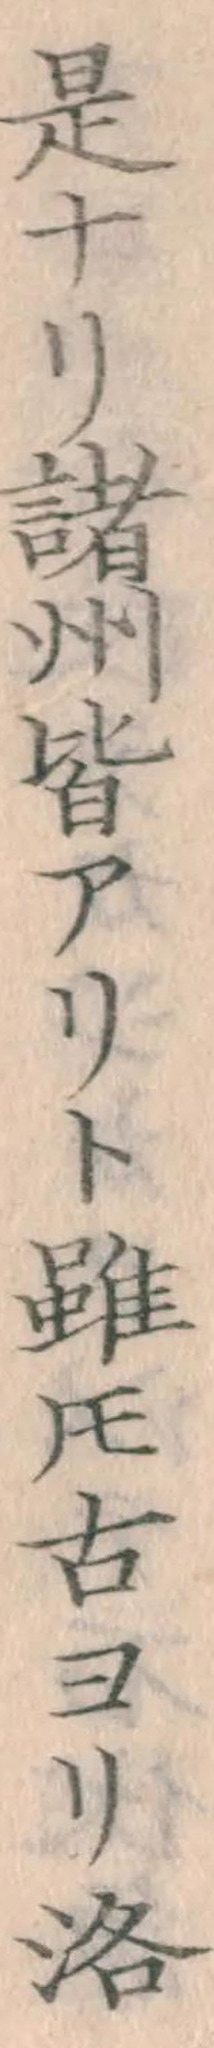是ナリ諸州皆アリト雖トモ古ヨリ洛
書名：皇和魚譜 2巻
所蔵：国立国会図書館 National Diet Library, JAPAN
